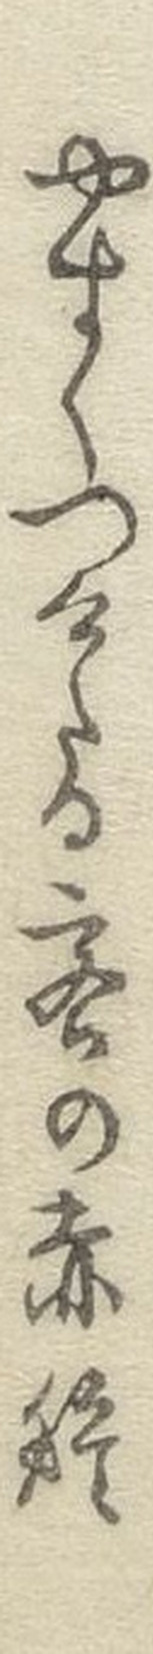やすくつけたる客の赤国盛
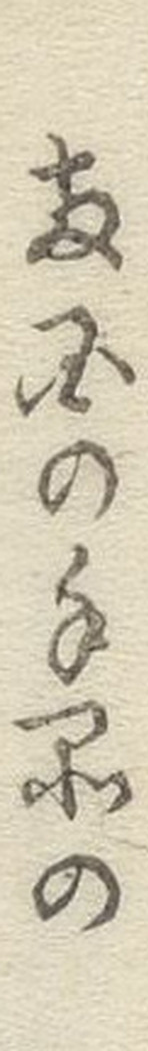両国の手品の
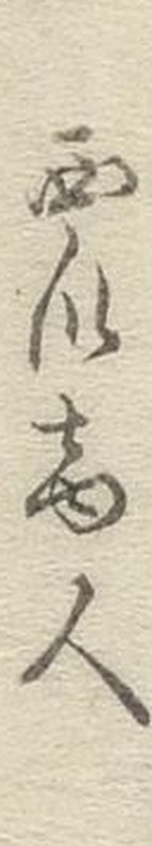西瓜商人
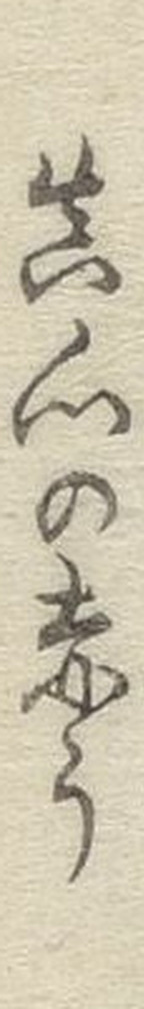真心の赤う
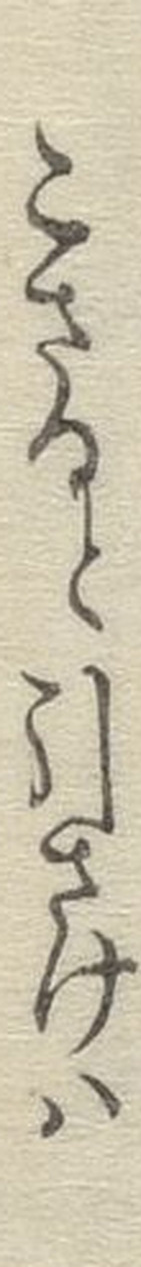こさると引さけは
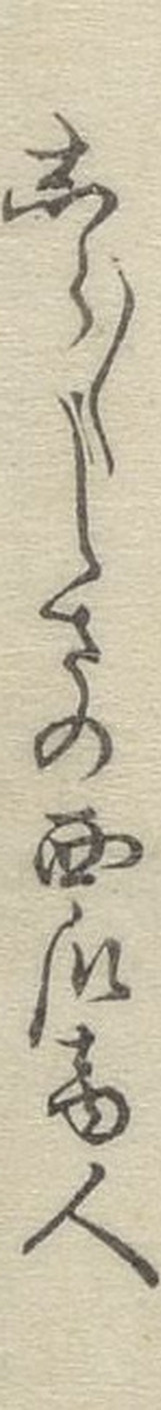しら〳〵しさの西瓜商人
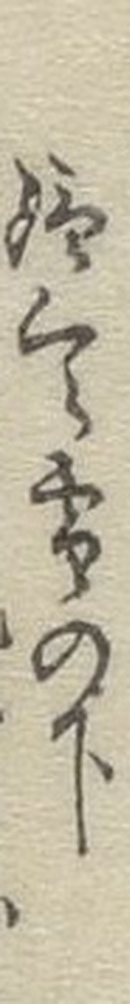鎌くら雪の下
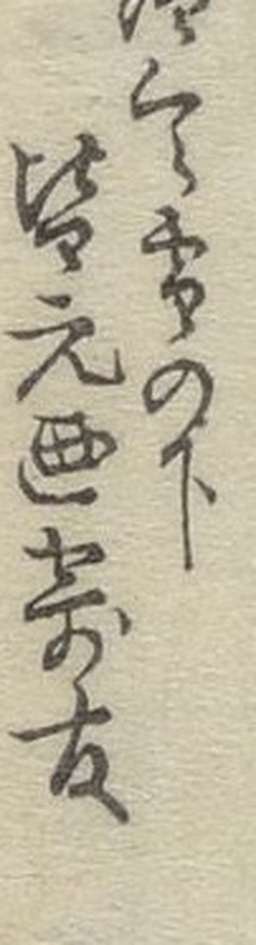皆元廼寄友

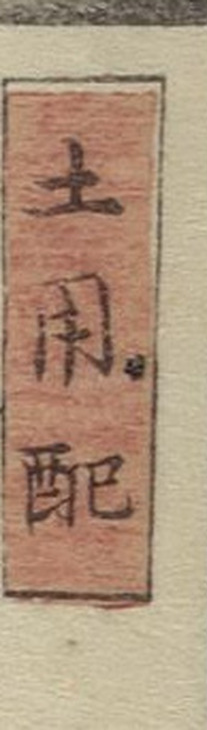土用配
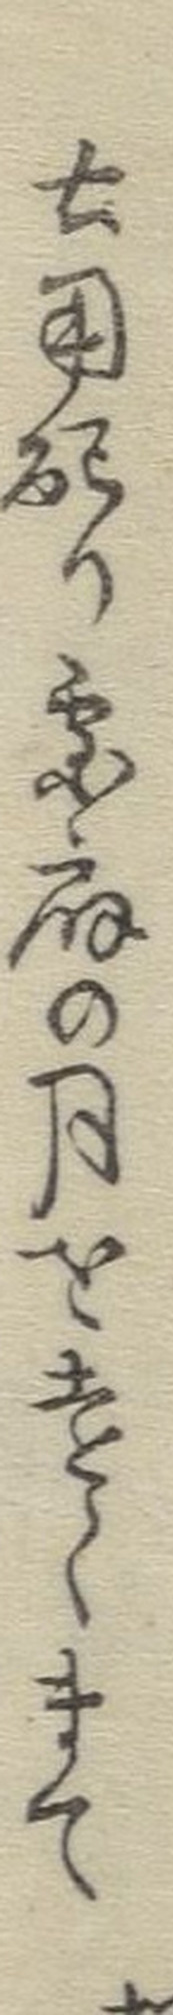土用配り団扇の月を遠くまて松月亭
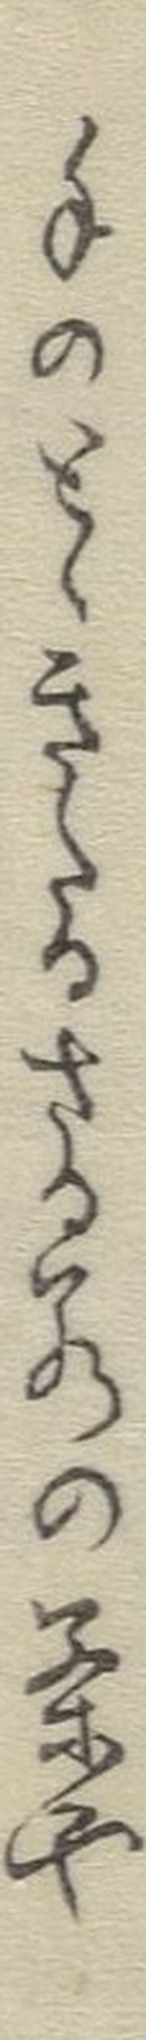手のとゝきたるさる若の茶や繁成
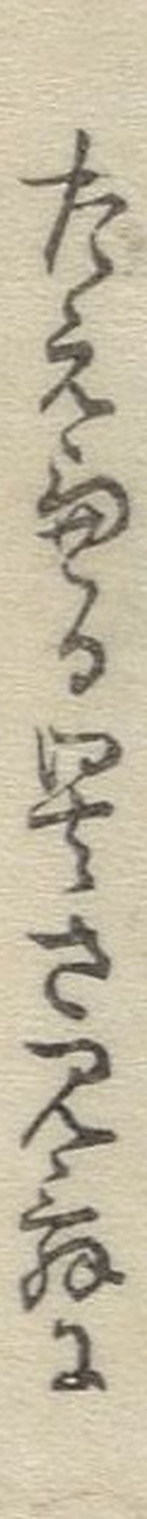たえ兼る暑さ見舞に
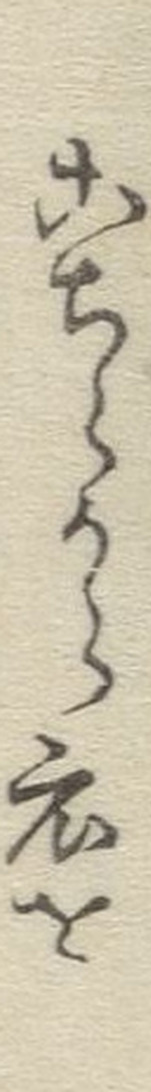こちらから衣を
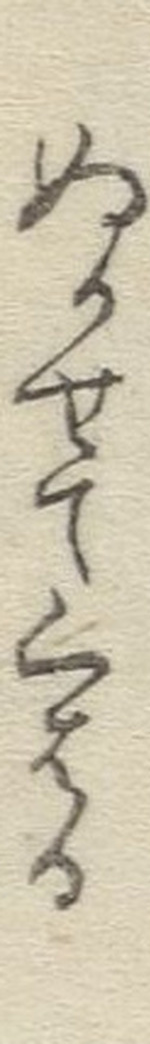ぬかせてくはる
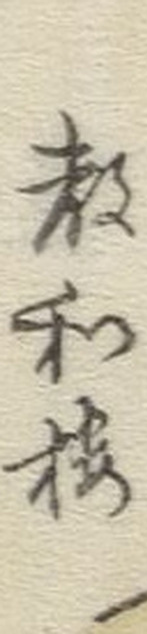教和楼
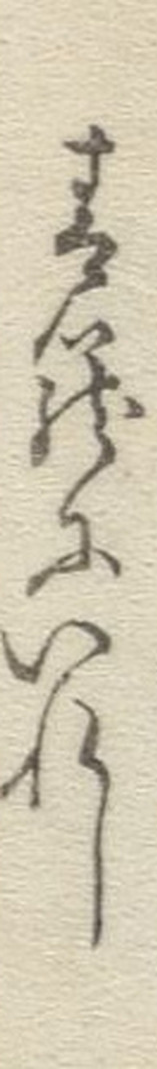青籠にいれし
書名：Picture Album of People with Kyōka (Light Verse) (Kyōka shiki jinbutsu 狂歌四季人物)
